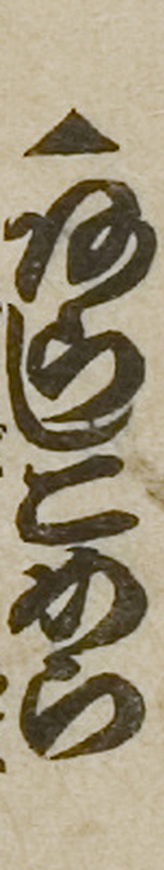▲あらしこめら
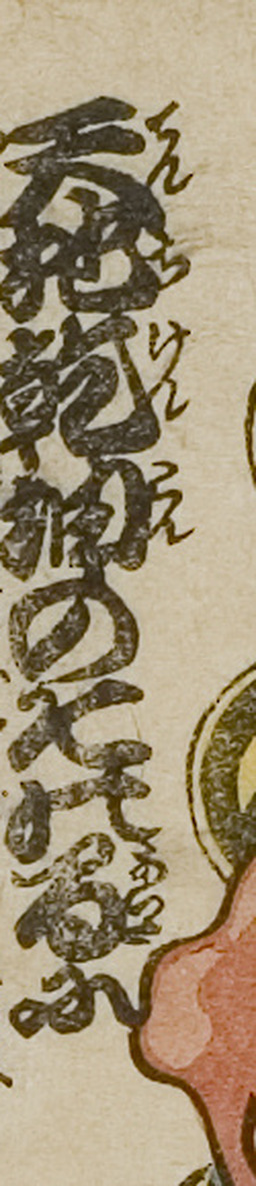天地乾坤のその間に
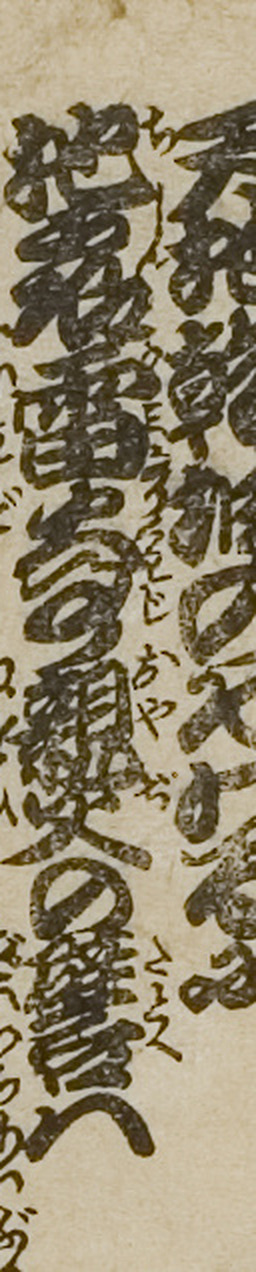地震雷火事親父の譬は
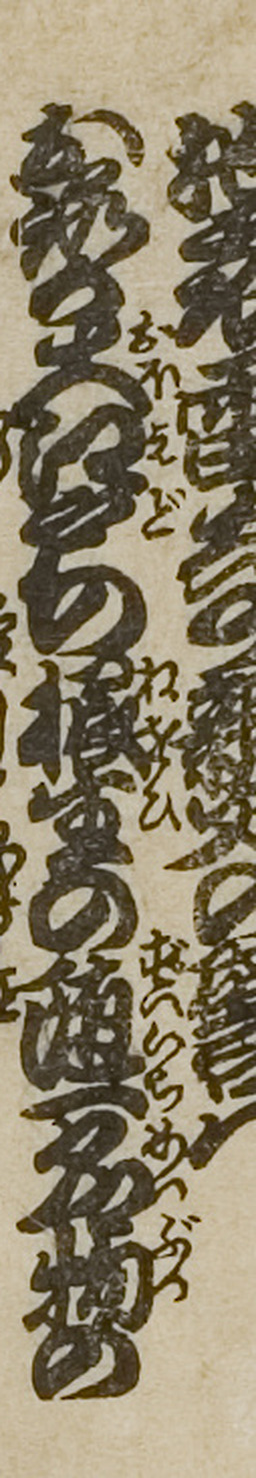おろか大江戸の根生の随一名物の
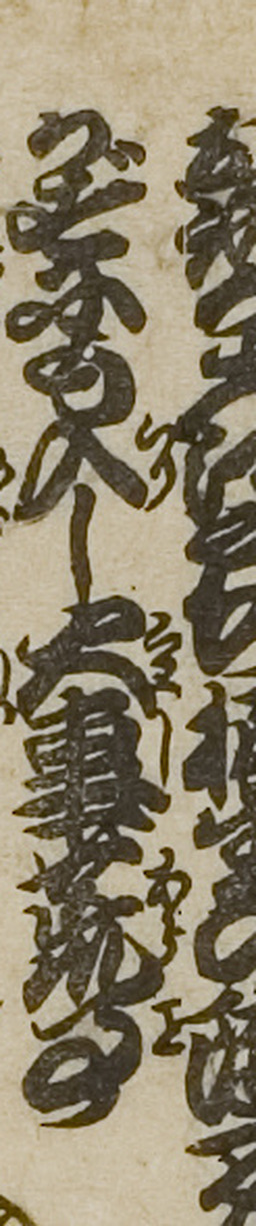かずにも入し火事荒事
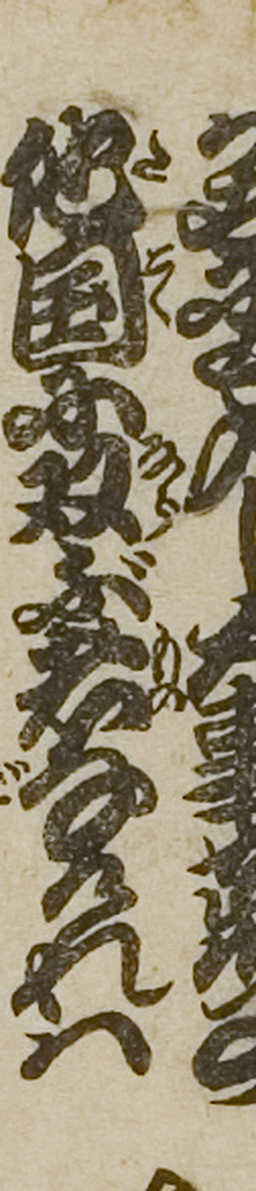他国に双ぶ者なければ
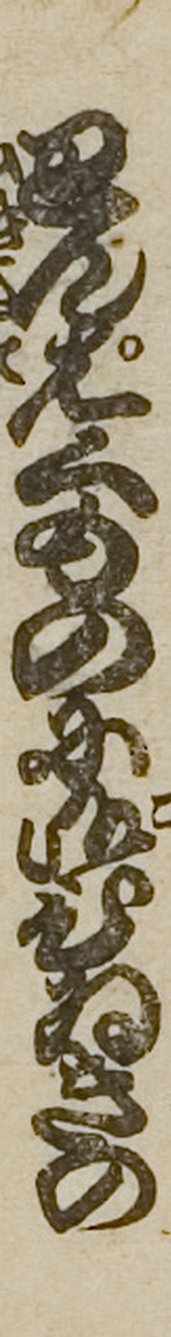んぱくものに御ひゐきの
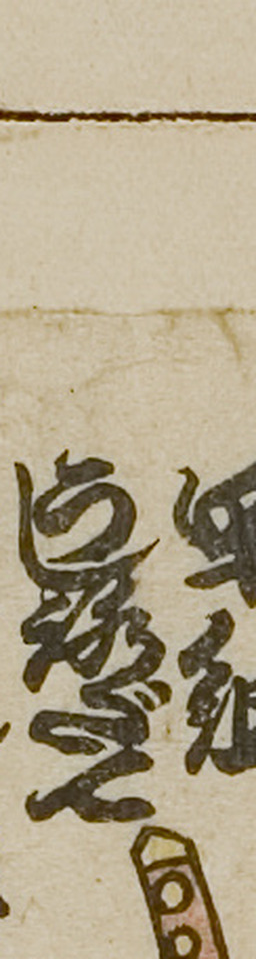うしろだて
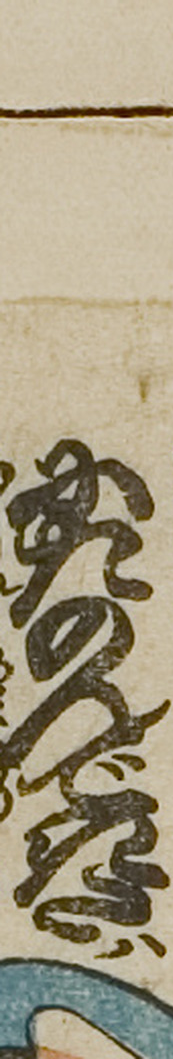にたのんできたは
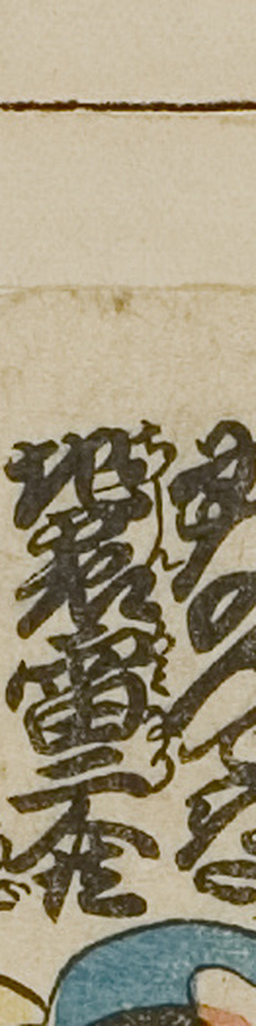地震雷二人共
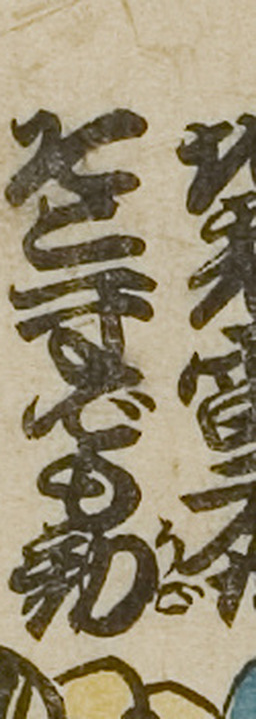そこ一寸でも動
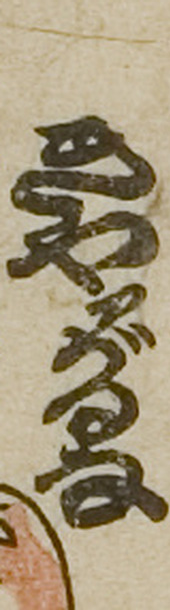きやあがるな
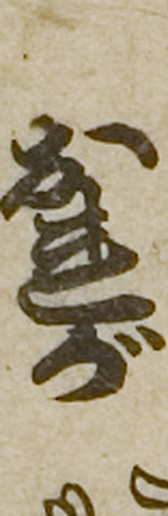おれが
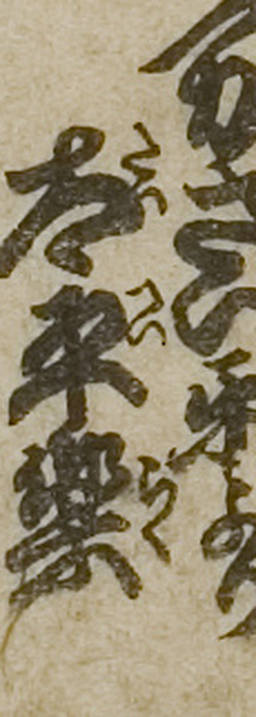太平楽
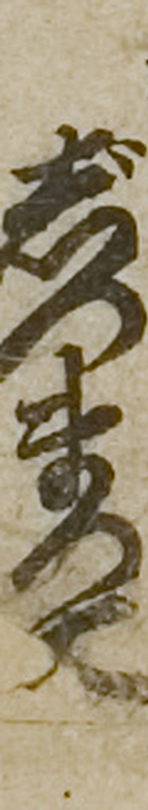じつまつて
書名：四民不動礎 吉例暫
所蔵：東京大学総合図書館 General Library in the University of Tokyo, JAPAN
